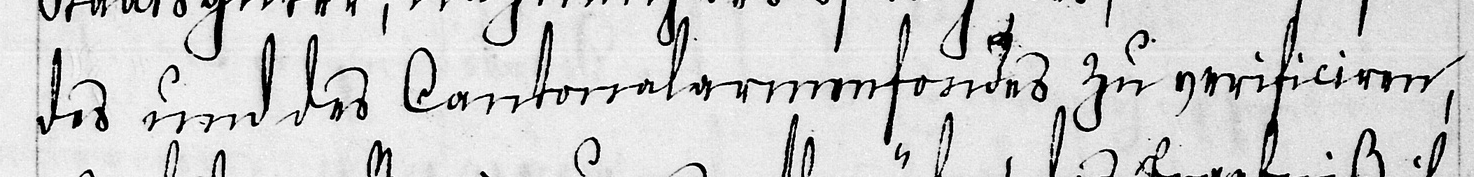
des und des Cantonalarmenfondes zu verificiren,
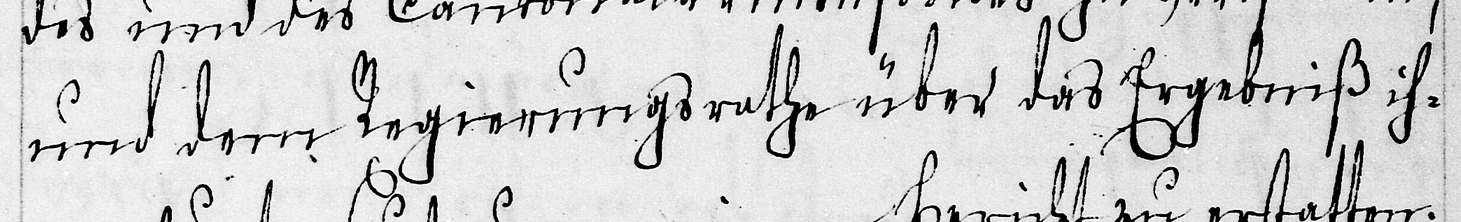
und dem Regierungsrathe über das Ergebniß ih¬
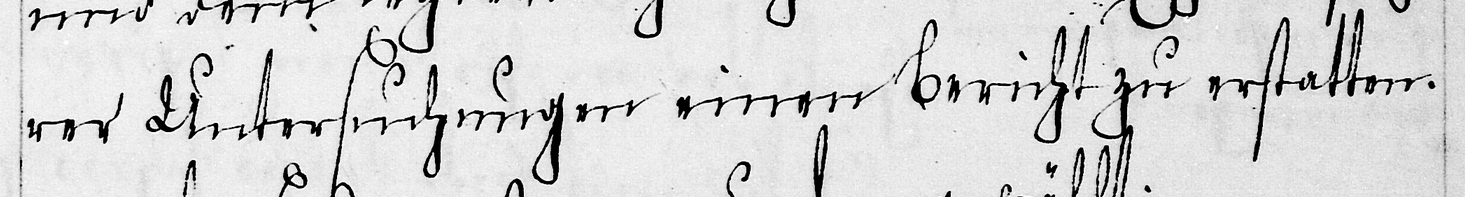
rer Untersuchungen einen Bericht zu erstatten.
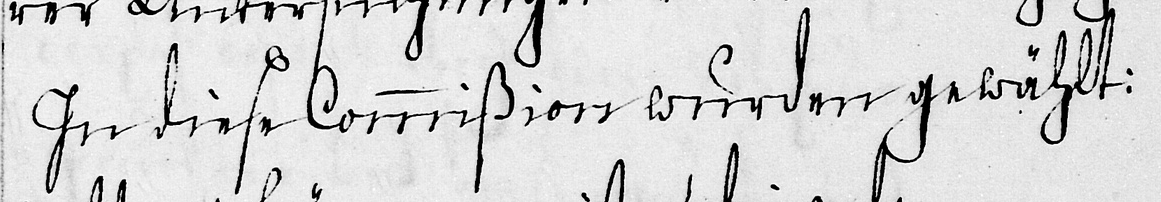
In diese Commißion wurden gewählt:
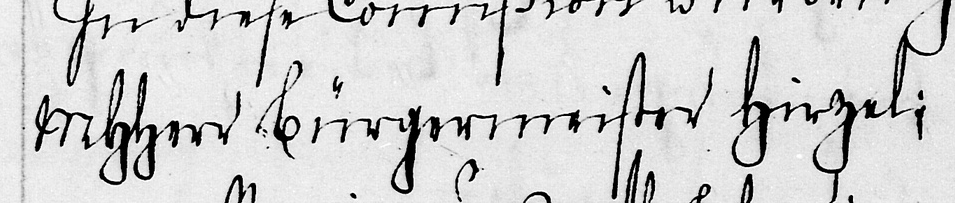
MHHerr Bürgermeister Hirzel;
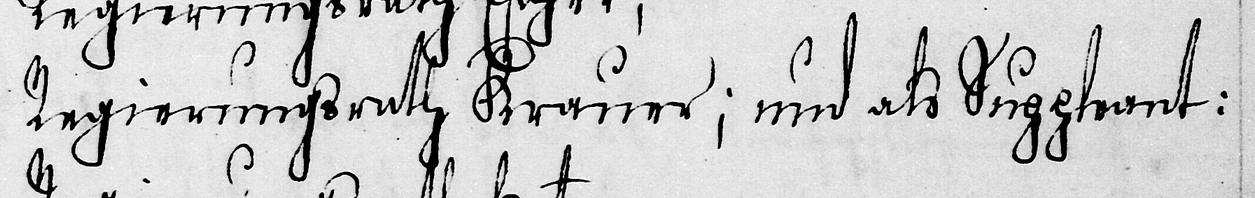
Regierungsrath Krauer; und als Suppleant:
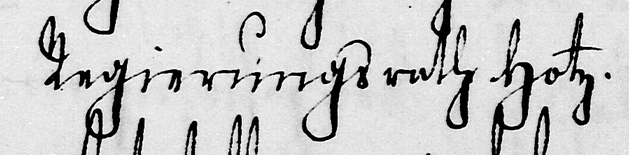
Regierungsrath Hotz.
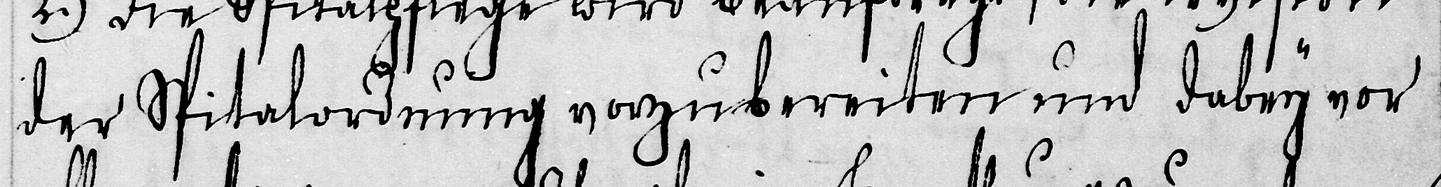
der Spitalordnung vorzubereiten und dabey vor
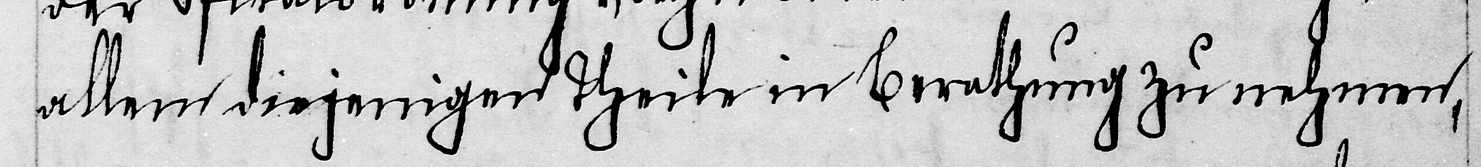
allem diejenigen Theile in Berathung zu nehmen,
